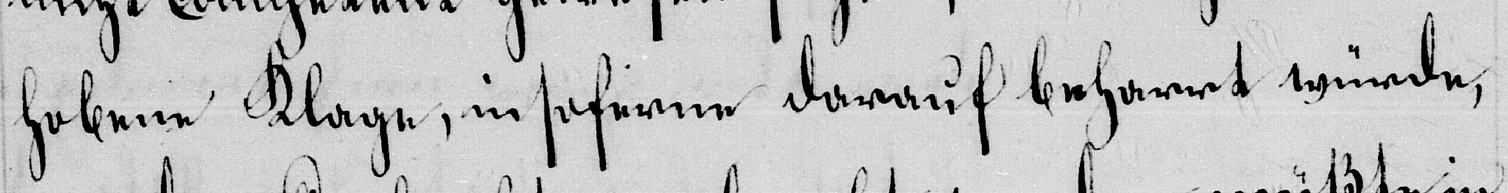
hobene Klage, insoferne darauf beharrt würde,
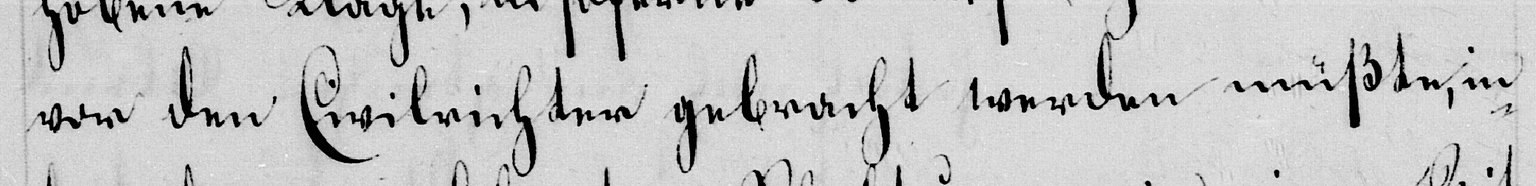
vor den Civilrichter gebracht werden müßte, in¬
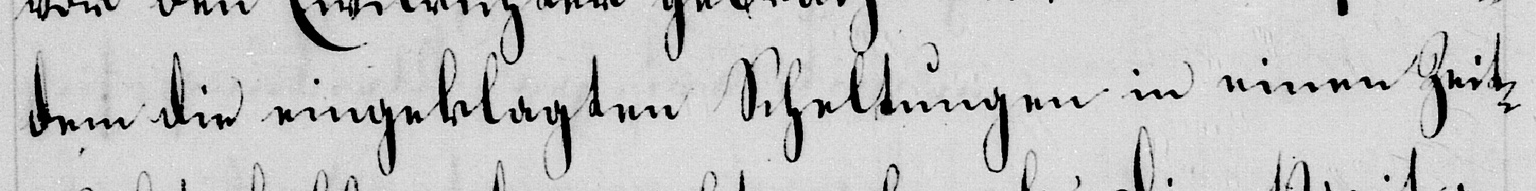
dem die eingeklagten Scheltungen in einen Zeit¬
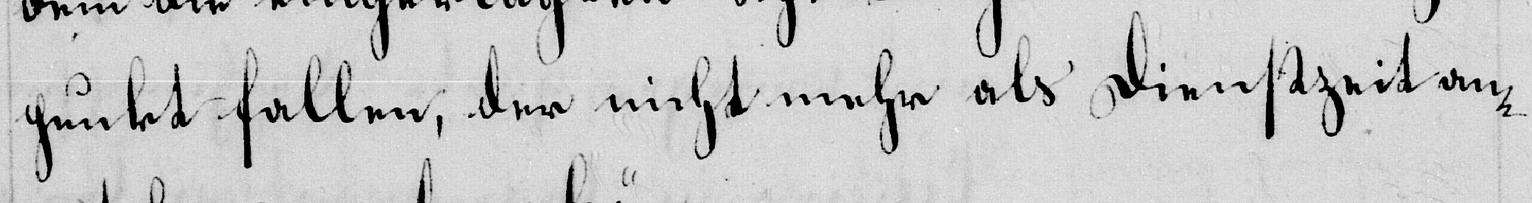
punkt fallen, der nicht mehr als Dienstzeit an¬
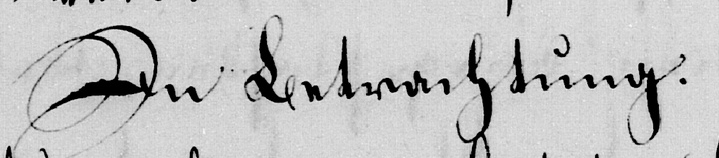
In Betrachtung:
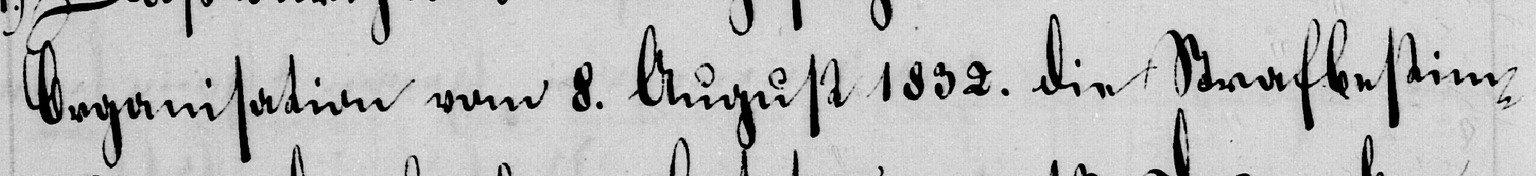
rganisation vom 8. August 1832. die Strafbestim¬
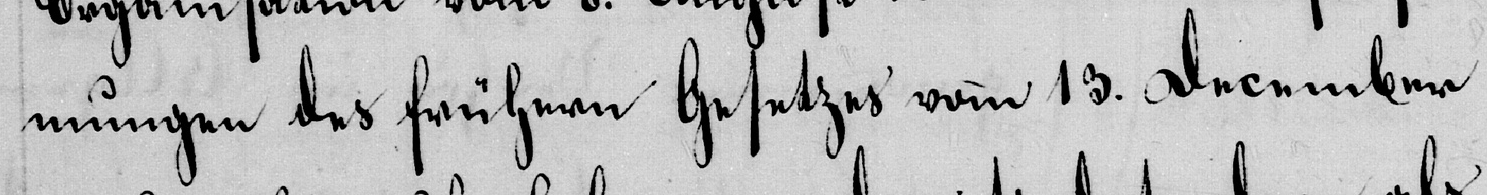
mungen des frühern Gesetzes vom 13. December
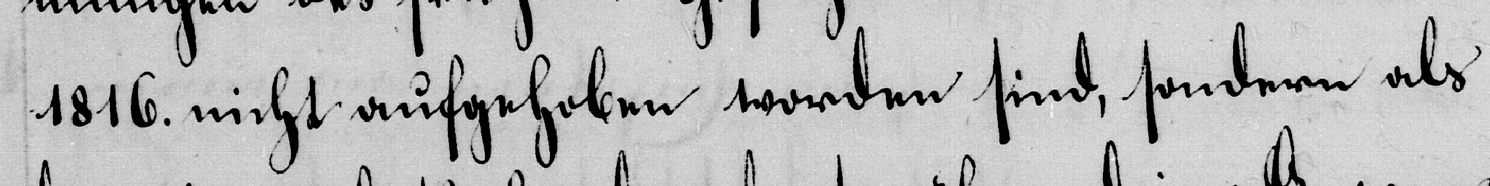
1816. nicht aufgehoben worden sind, sondern als
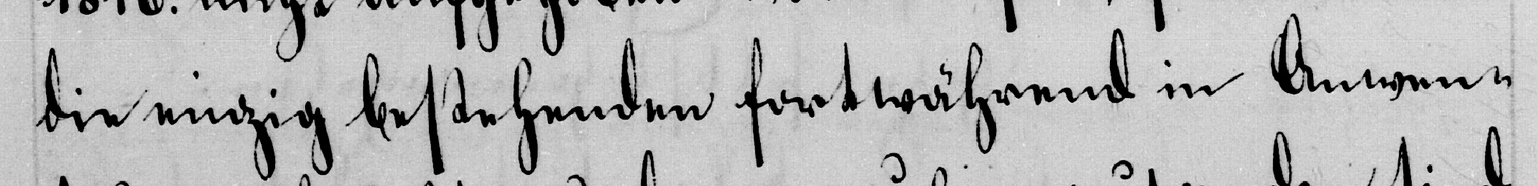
die einzig bestehenden fortwährend in Anwen¬
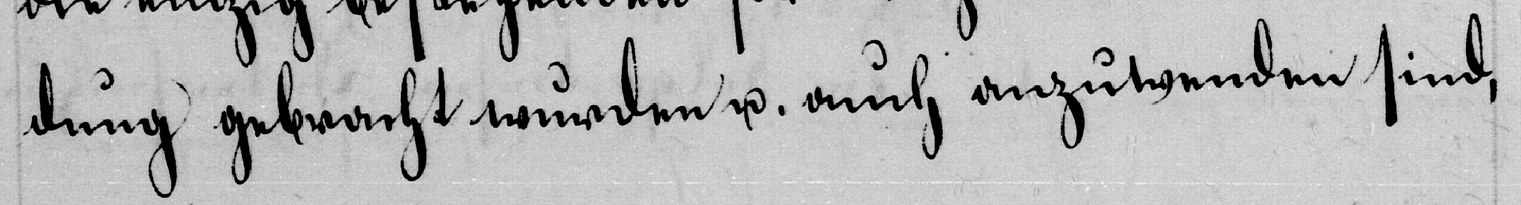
dung gebracht wurden u. auch anzuwenden sind,
